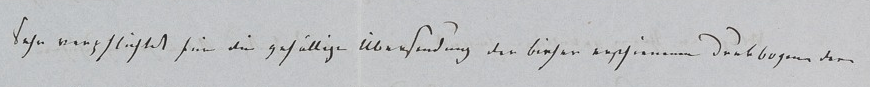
Sehr verpflichtet für die gefällige Übersendung der bisher erschienenen Drukbogen der
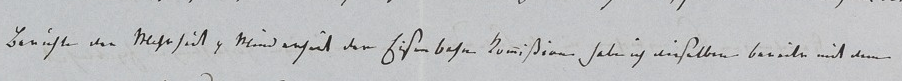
Berichte der Mehrheit & Minderheit der Eisenbahn Kommßion habe ich dieselben bereits mit dem
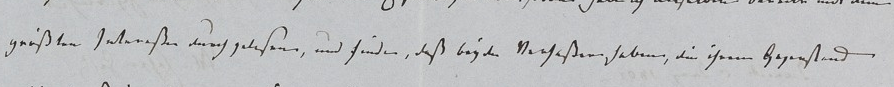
größten Intereße durch gelesen, und finde, daß beyde Verfaßer haben, die ihren Gegenstand
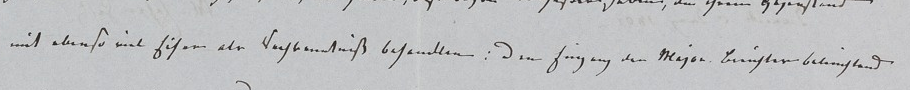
mit ebenso viel Eifer als Sachkenntniß behandlen: Den Eingang des Major. Berichtes beleuchtend
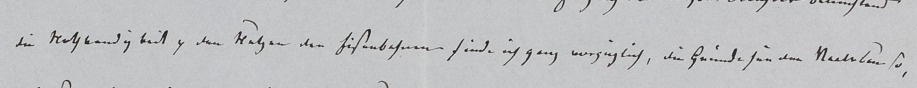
die Nothwendigkeit & den Nutzen der Eisenbahnen finde ich ganz vorzüglich, die Gründe für den Staatsbau so,
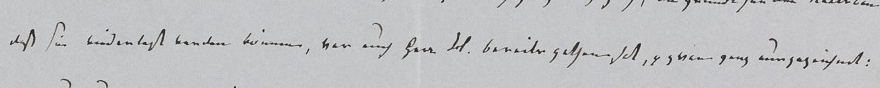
daß sie wiederlegt werden können, was auch herr H bereits gethan hat, & zwar ganz ausgezeichnet:
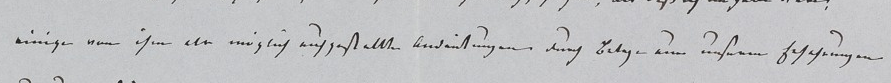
einige von ihm als möglich aufgestellte Andeutungen durch Belege aus unseren Erfahrungen
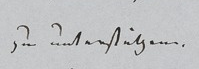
zu unterstützen.
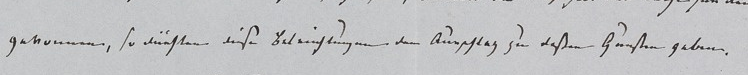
gewonnen, so dürften diese Beleuchtungen den Ausschlag zu deßen Gunsten geben.
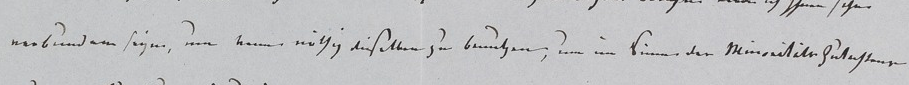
verbunden seyn, um wenn nöthig dieselben zu benutzen, um im Sinne des Minoritäts Gutachtens
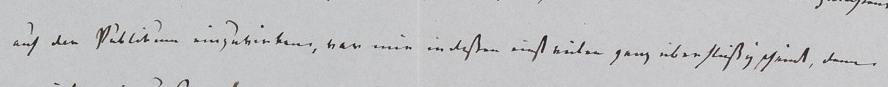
auf das Publikum einzuwirken, was mir indeßen einstweilen ganz überflüßig scheint, denn
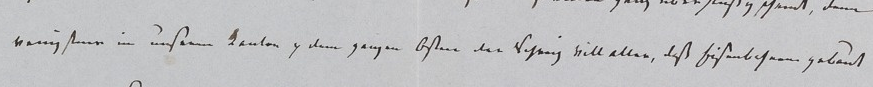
wenigstens in unserm Kanton & dem ganzen Osten der Schweiz will alles, daß Eisenbahnen gebaut
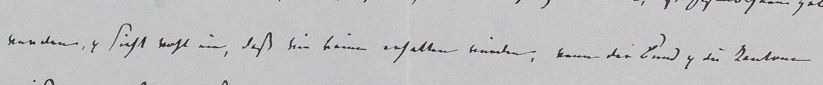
werden, & sieht wohl ein, daß wir keine erhalten würden, wenn der Bund & die Kantone
